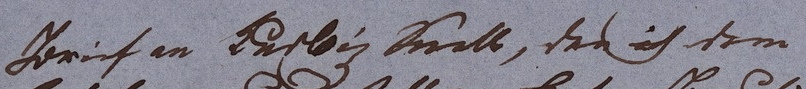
Brief an Ludwig Snell, den ich dem
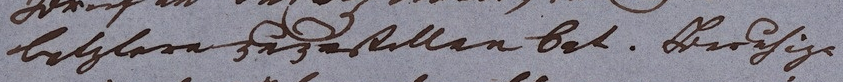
letztern zuzustellen bat. Beruhige
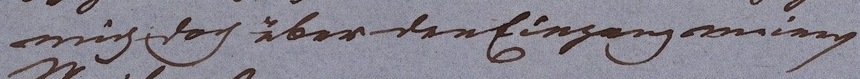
mich doch über den Eingang meines
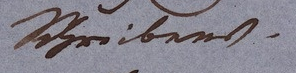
Schreibens.
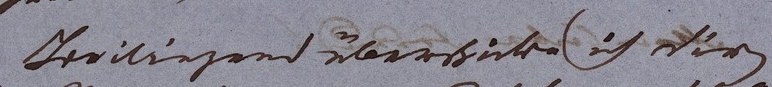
Beiliegend überschicke ich Dir
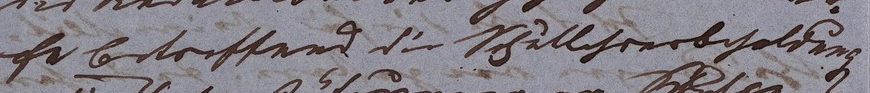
fe betreffend die Schullehrerbesoldung
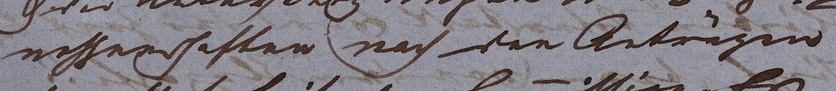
nossenschaften nach den Anträgen
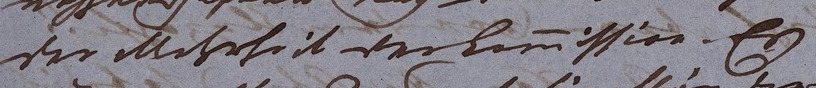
der Mehrheit der Commission. Es
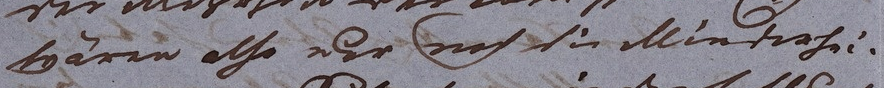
wären also nur noch die Minderhei-
